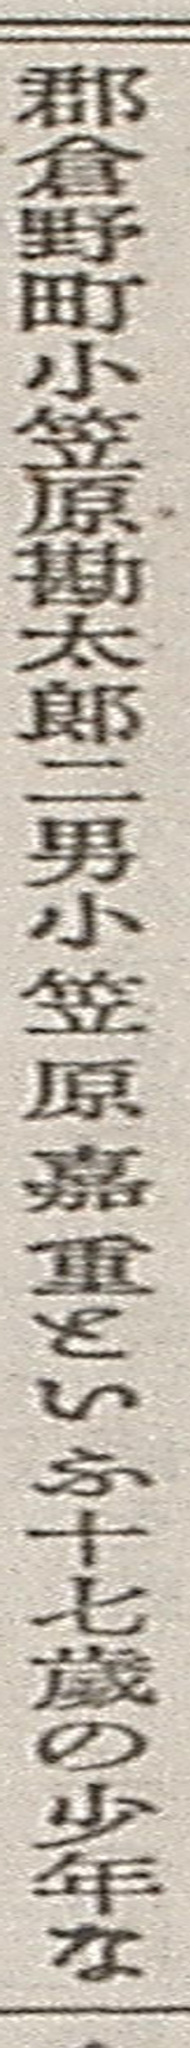郡倉野町小笠原勘太郎二男小笠原嘉重といふ十七歳の少年な
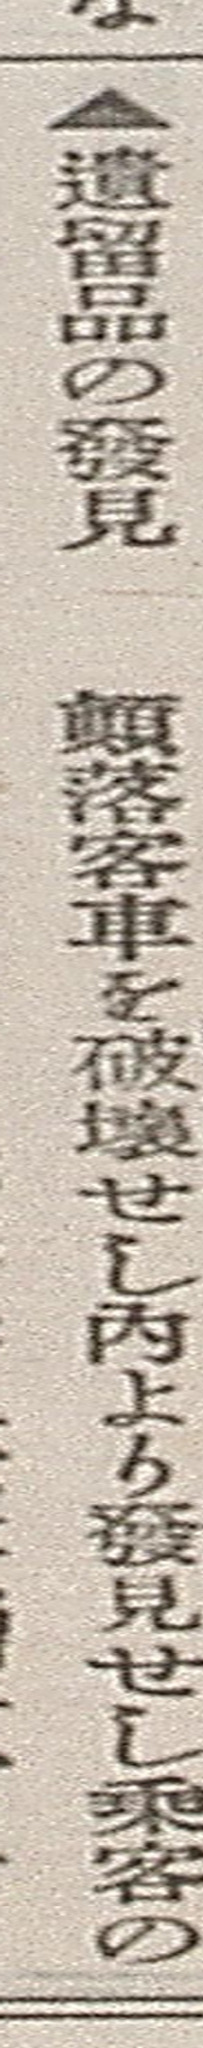▲遺留品の発見顛落客車を破壊せし内より発見せし乗客の
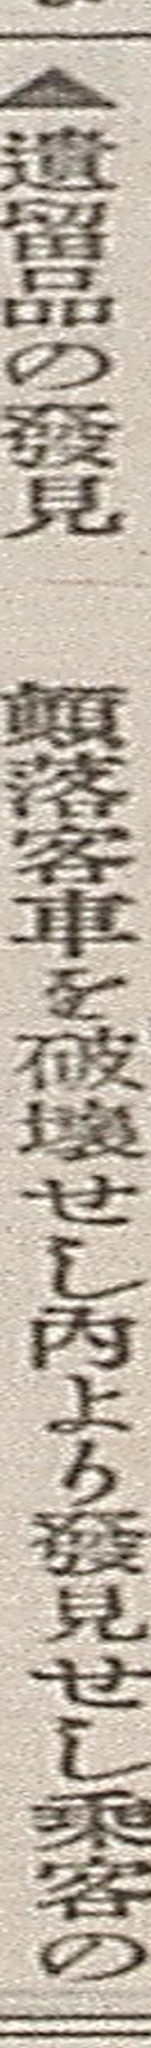▲遺留品の発見顛落客車を破壊せし内より発見せし乗客の
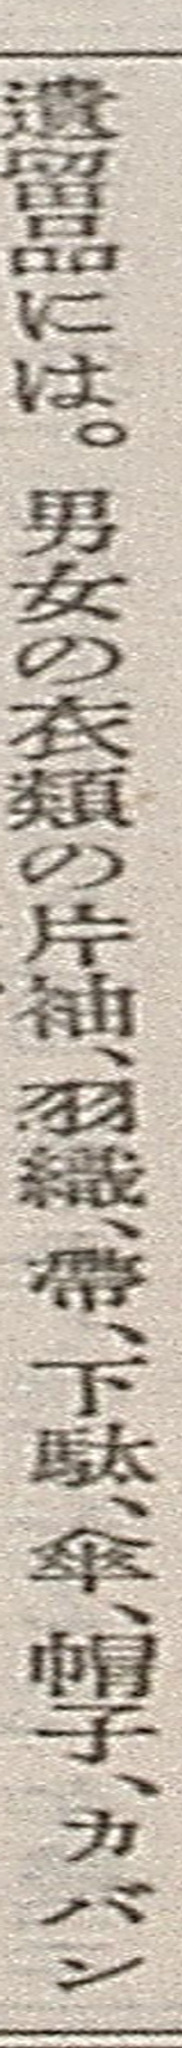遺留品には。男女の衣類の片袖、羽織、帯、下駄、傘、帽子、カバン
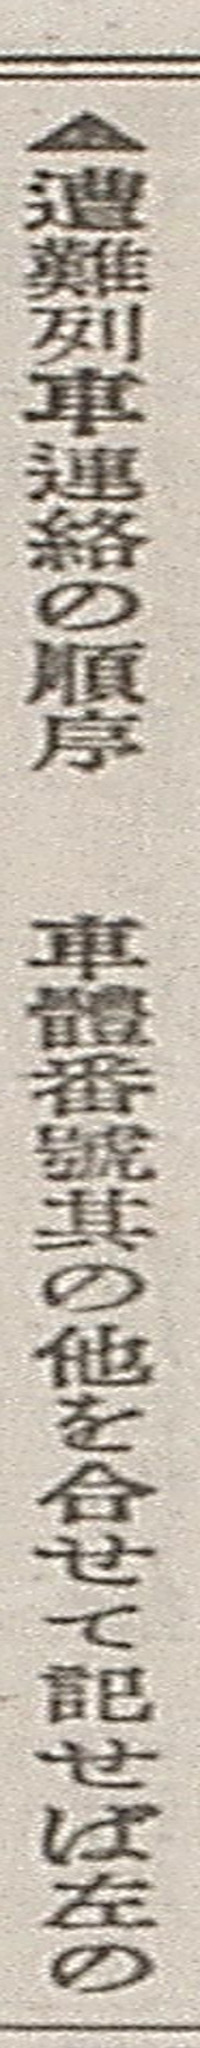▲遭難列車連絡の順序車体番号其の他を合せて記せば左の
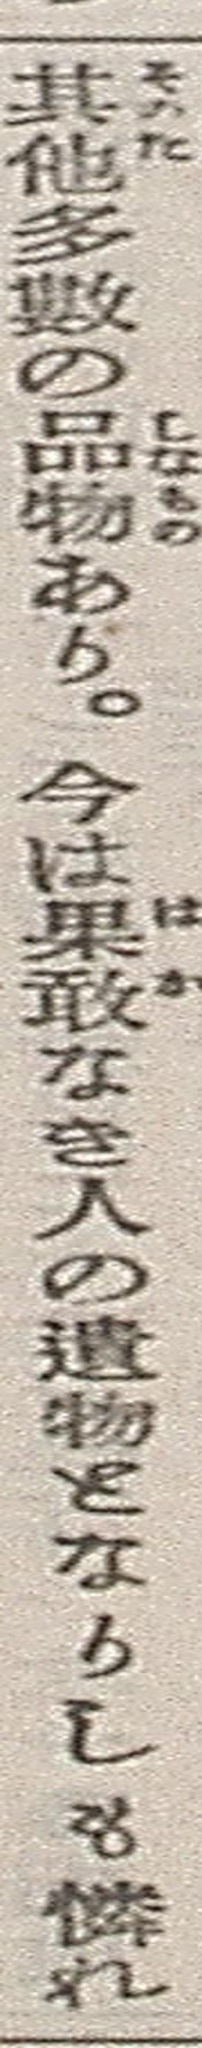其他多数の品物あり。今は果敢なき人の遺物となりしも憐れ
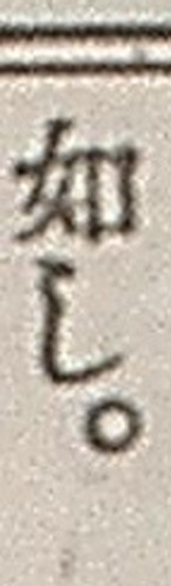如し。
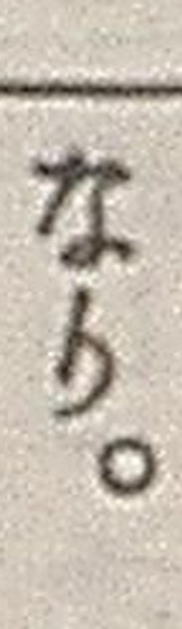なり。
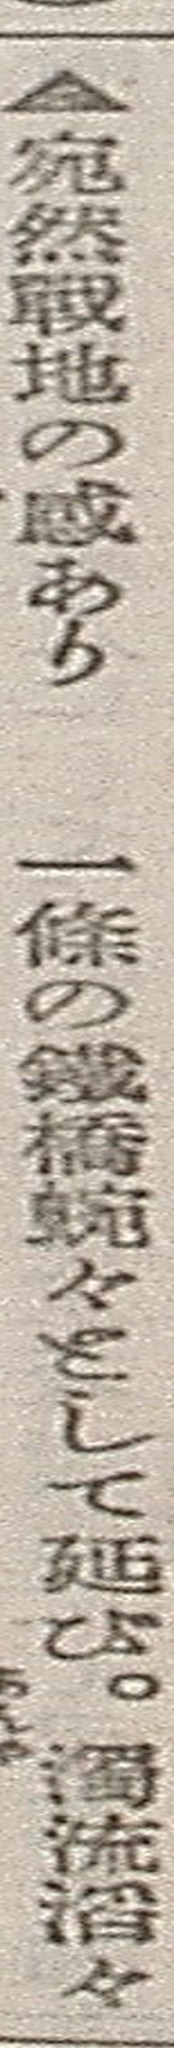▲宛然戦地の感あり一条の鉄橋蜿々として延び。濁流滔々
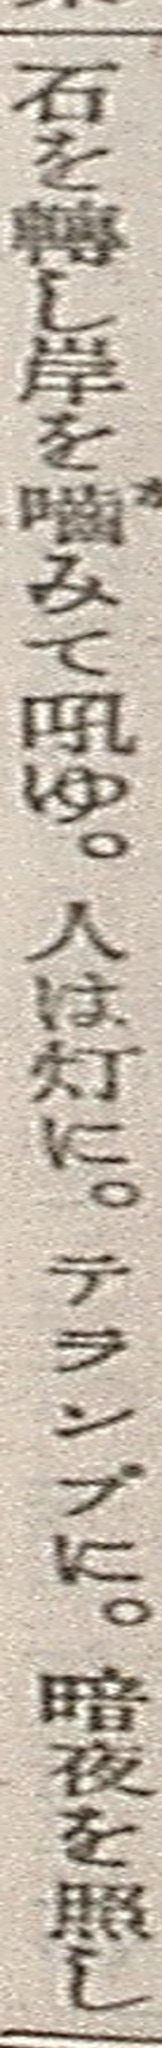石を転し岸を噛みて吼ゆ。人は灯に。テランプに。暗夜を照し
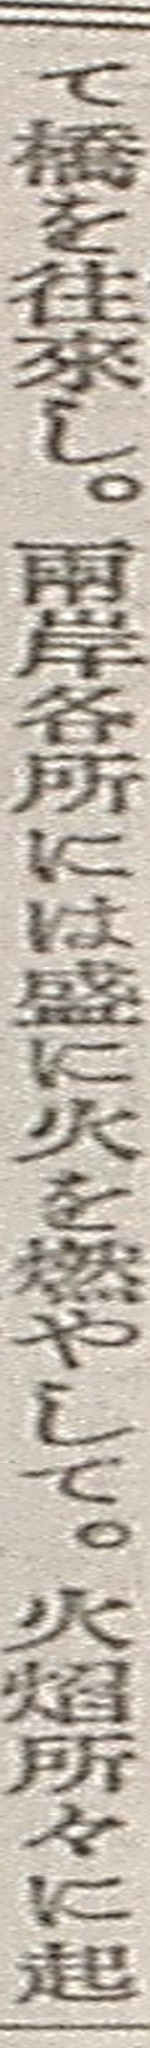て橋を往来し。両岸各所には盛に火を燃やして。火焔所々に起
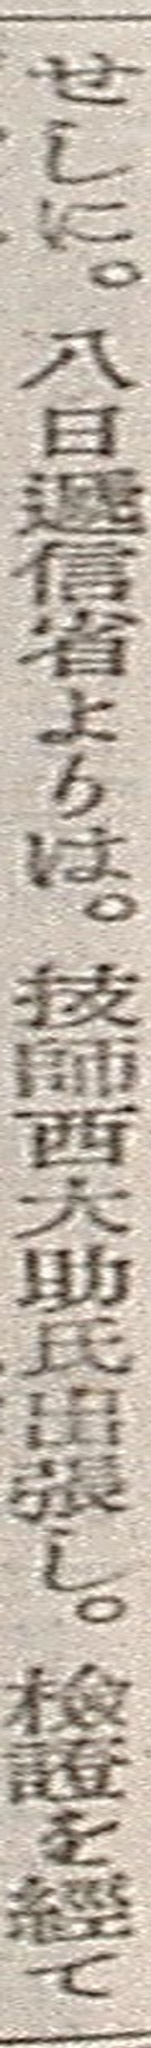せしに。八日逓信省よりは。技師西大助氏出張し。検証を経て
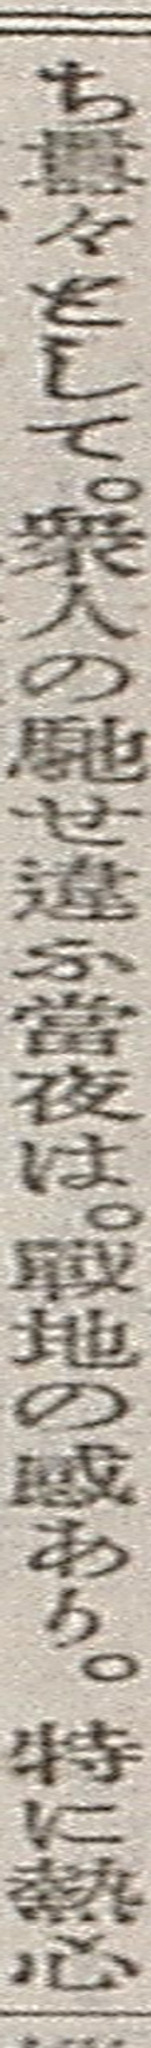ち囂々として。衆人の馳せ違ふ当夜は。戦地の感あり。特に熱心
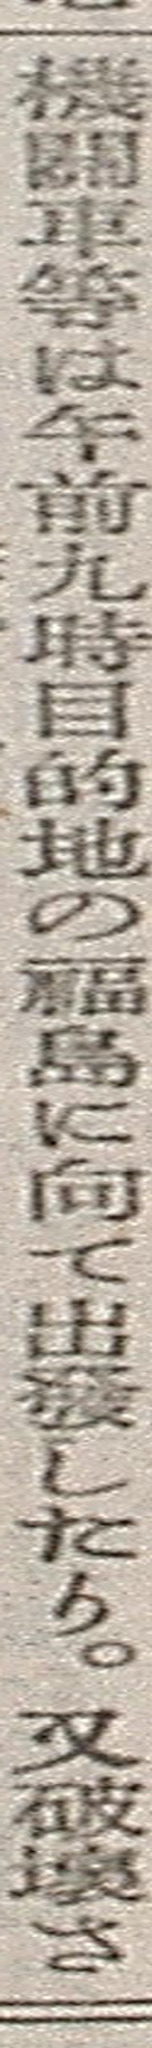機関車等は午前九時目的地の福島に向て出発したり。又破壊さ
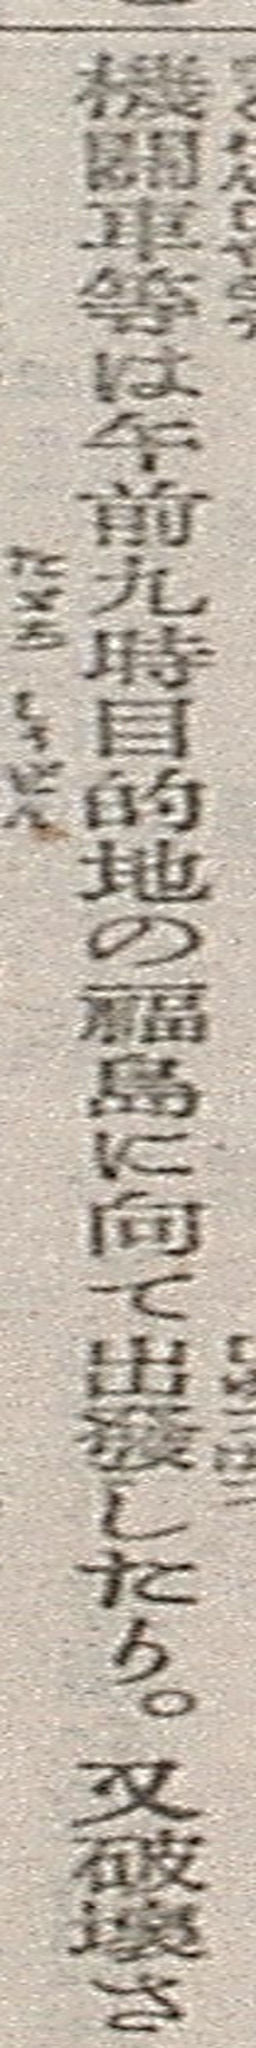機関車等は午前九時目的地の福島に向て出発したり。又破壊さ
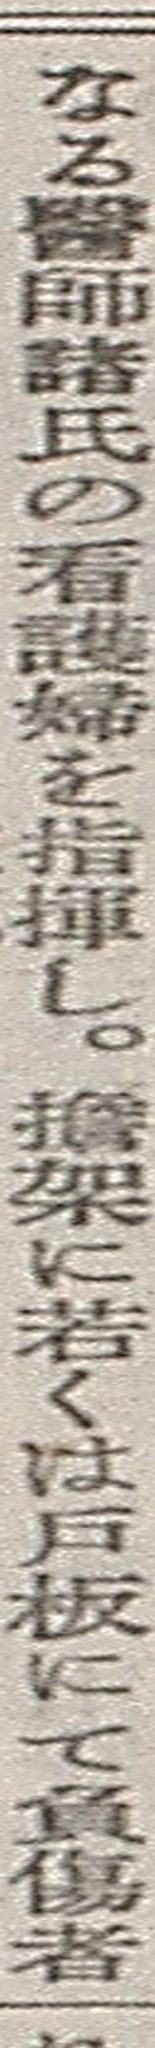なる医師諸氏の看護婦を指揮し。担架に若くは戸板にて負傷者
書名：風俗畫報臨時増刊第百九十九號　明治三十二年十月各地災害圖會（前編之續）
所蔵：東京大学地震研究所図書室 Earthquake Research Institute Library, The University of Tokyo, JAPAN
